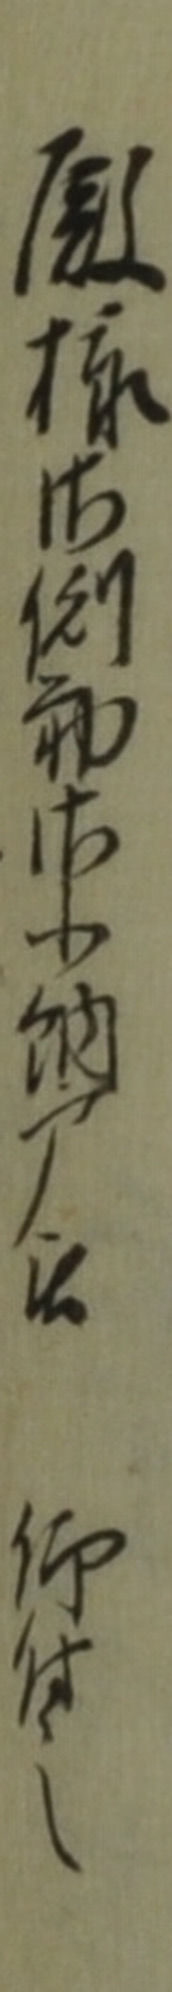殿様御側勤御小納戸被仰付之
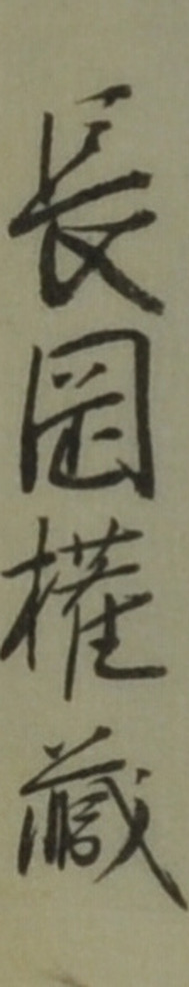長岡権蔵
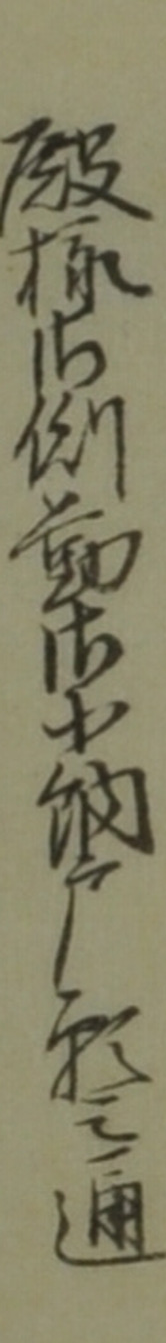殿様御側勤御小納戸願之通
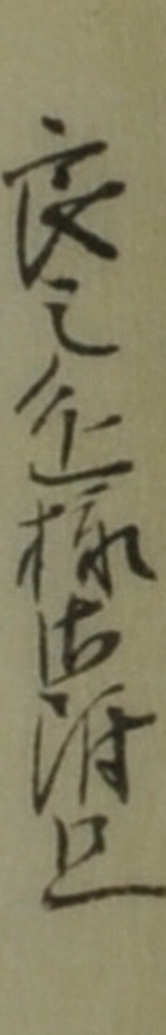良之進様御附且
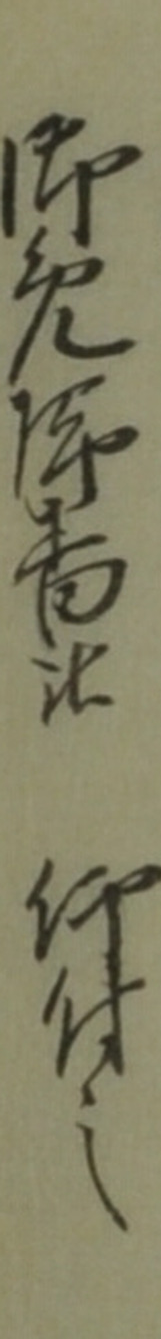御免帰番被仰付之
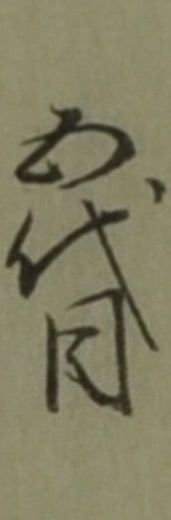五代目
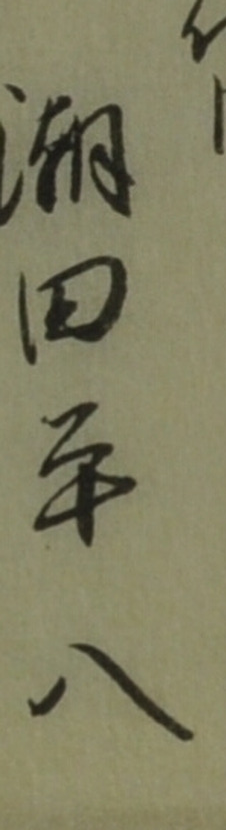潮田平八
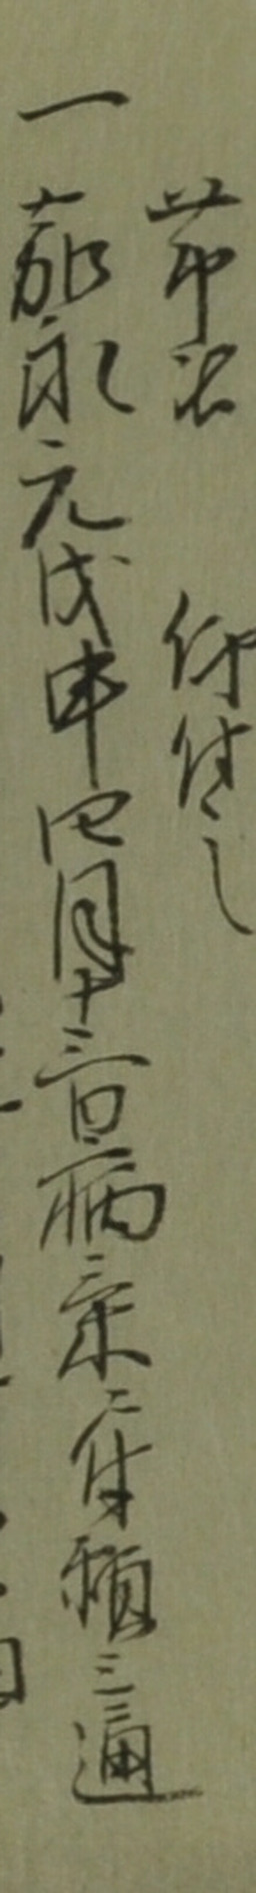一嘉永元戊申四月十三日病床ニ付願之通
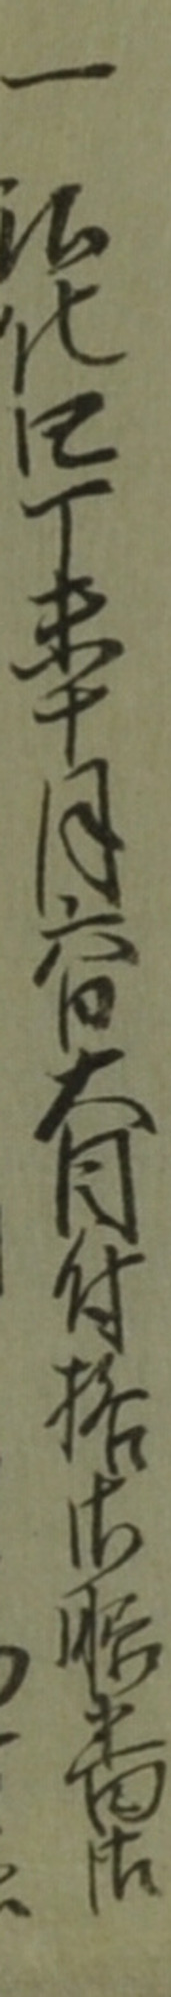一弘化四丁未十月六日大目付格御膳番御
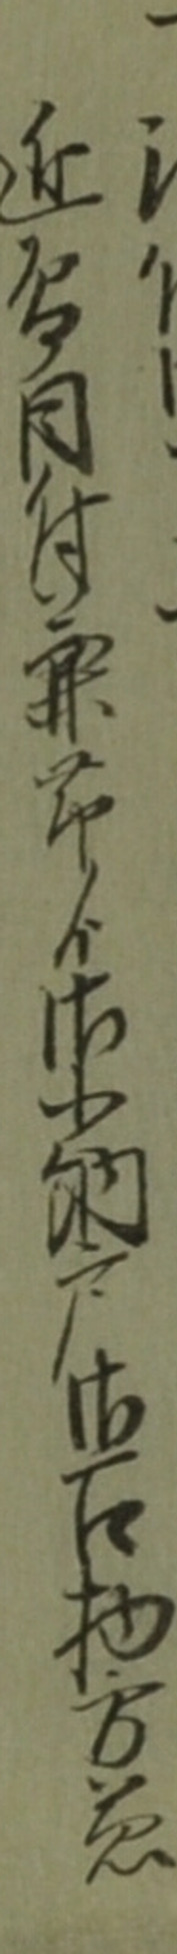近習目付兼帯ゟ御小納戸御召物方兼
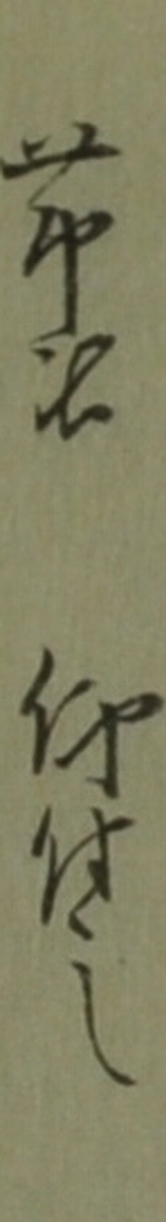帯被仰付之
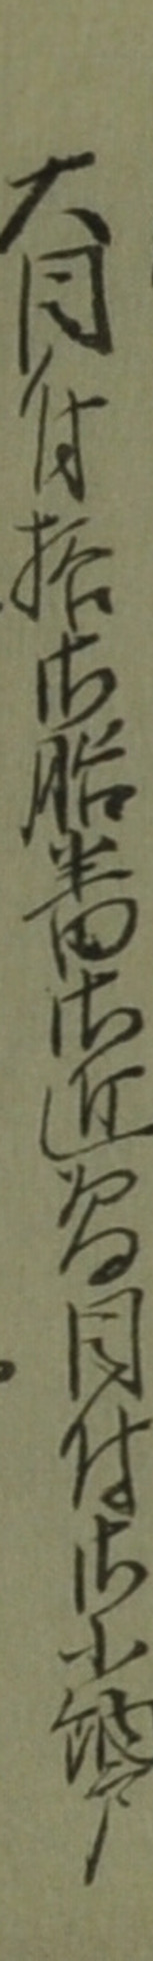御目付格御膳番御近習目付御小納戸
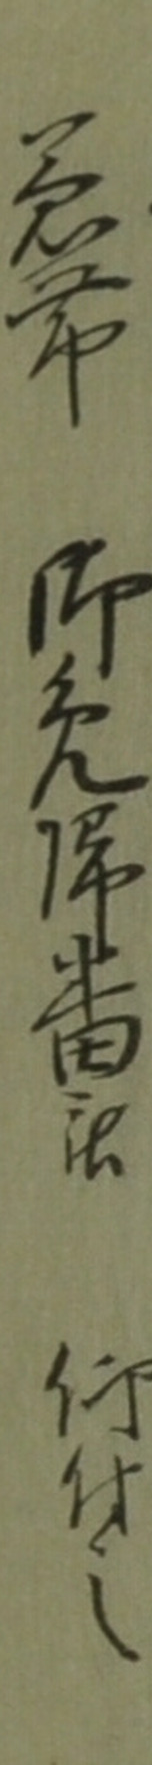兼帯御免帰番被仰付之

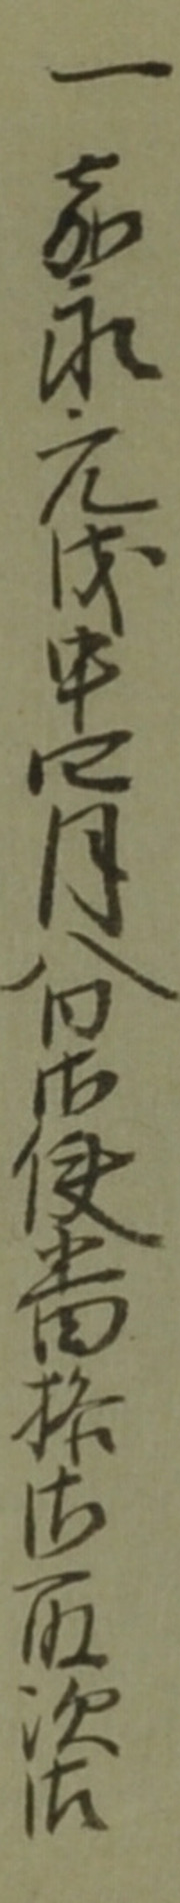一嘉永元戌申四月八日御使番格御取次御
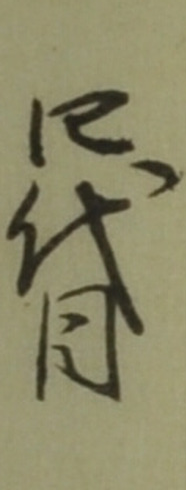四代目
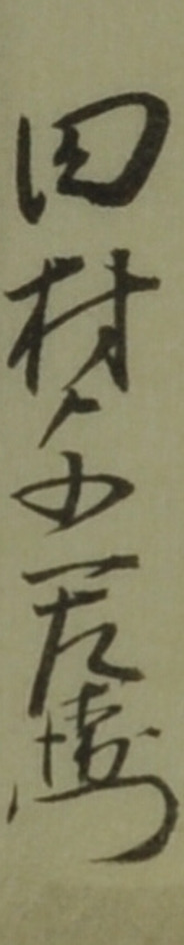田村与一左衛門
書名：諸御役代々録（四）
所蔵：伊那市立高遠町図書館・合同会社AMANE
